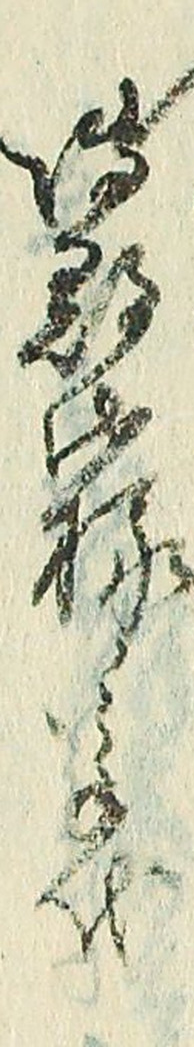御郡代様御手代
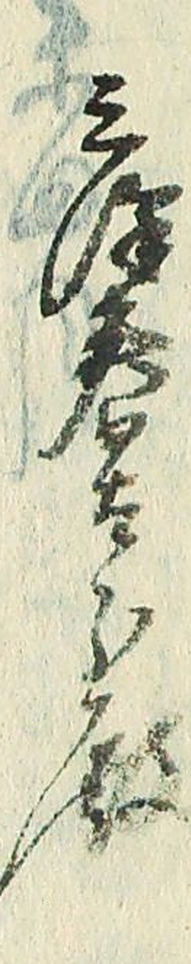三沢春太郎殿
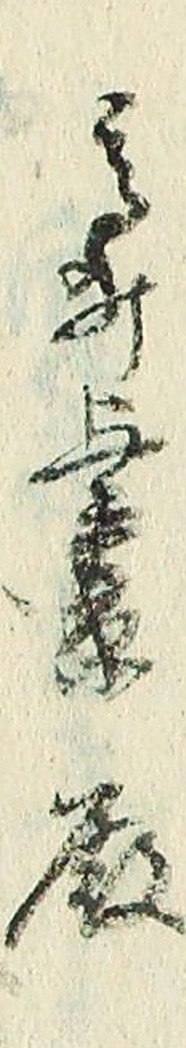高井与三兵衛殿
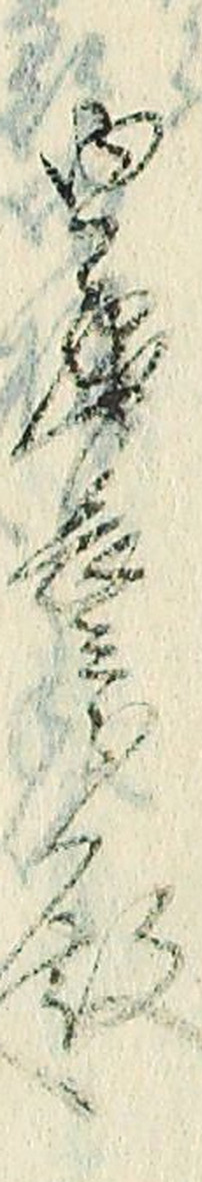内藤長三郎殿
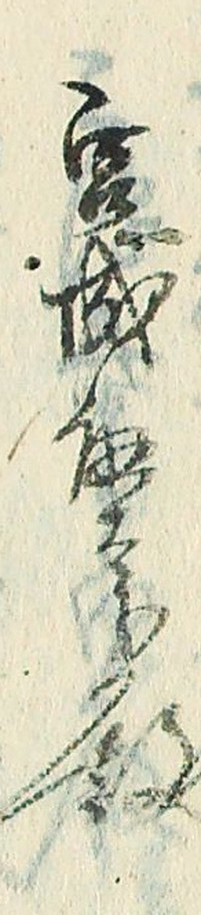宮城麻太郎

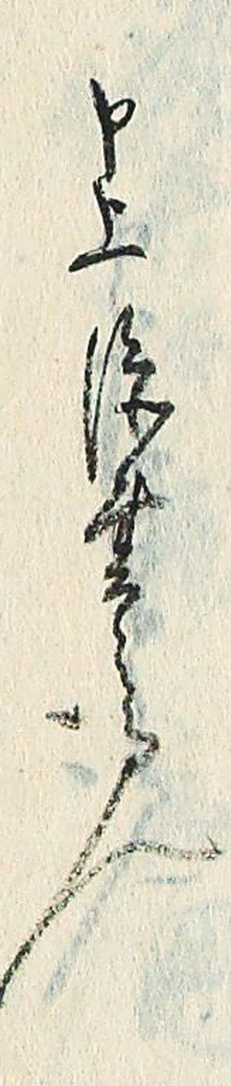申上添書之覚
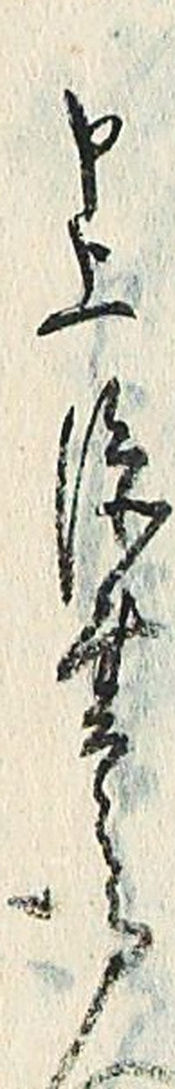申上添書之覚
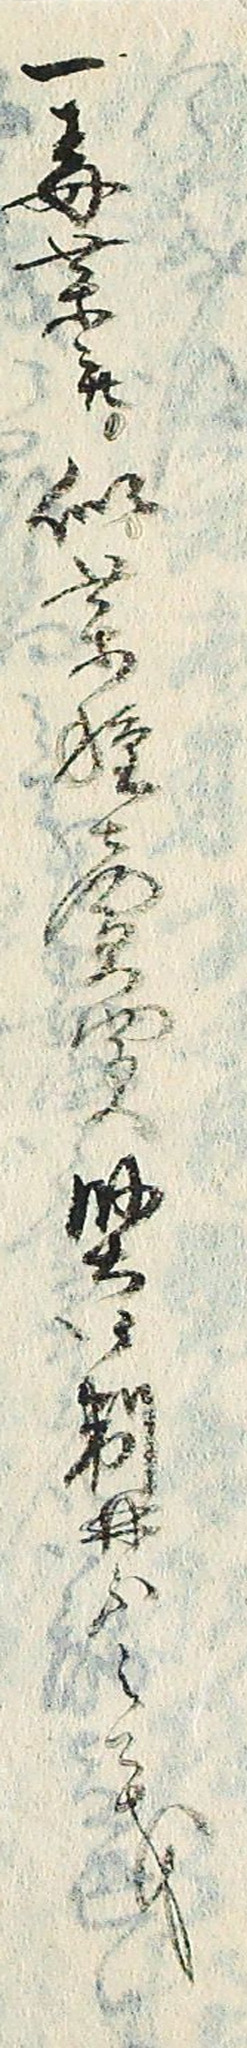一毒薬幷似薬種売買堅御制禁之義
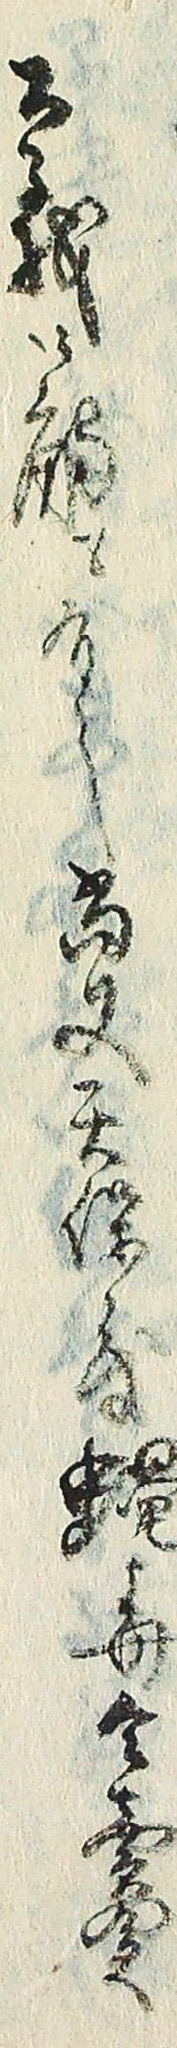公義御触も有之尚又天保度蠅毒令売買
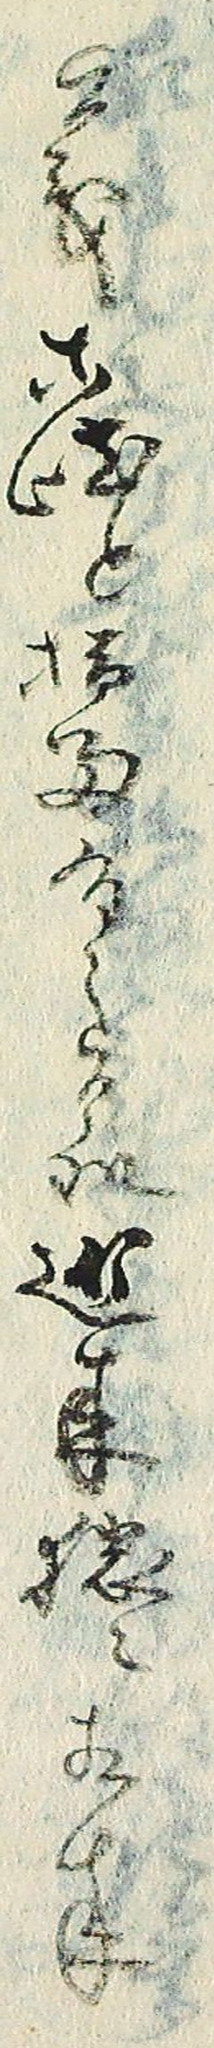候義等屹と指留有之候之処近来猥に相成
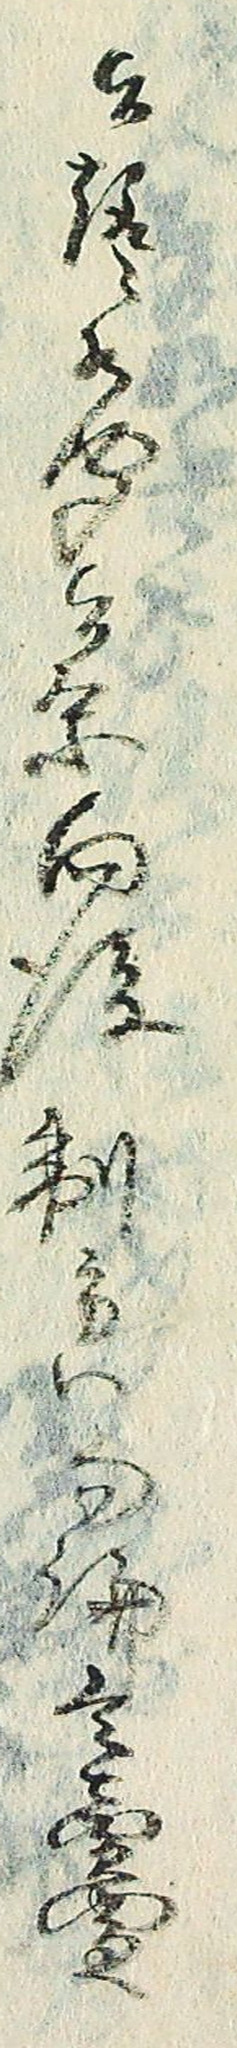候趣に相聞候条向後制方は勿論令売買
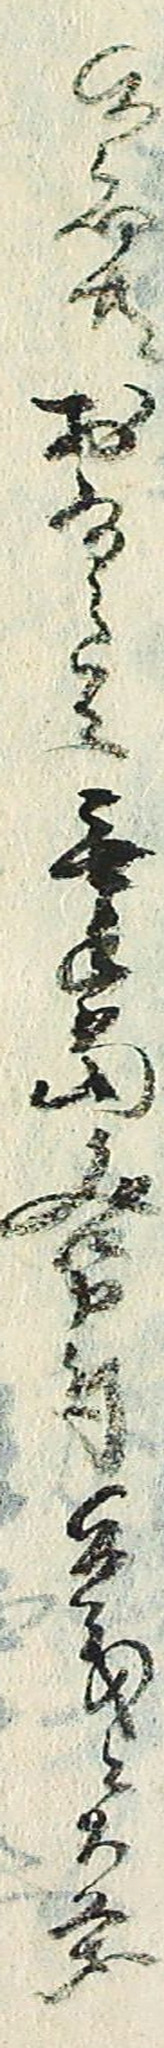候者共於有之は無手当咎申付候義に候条
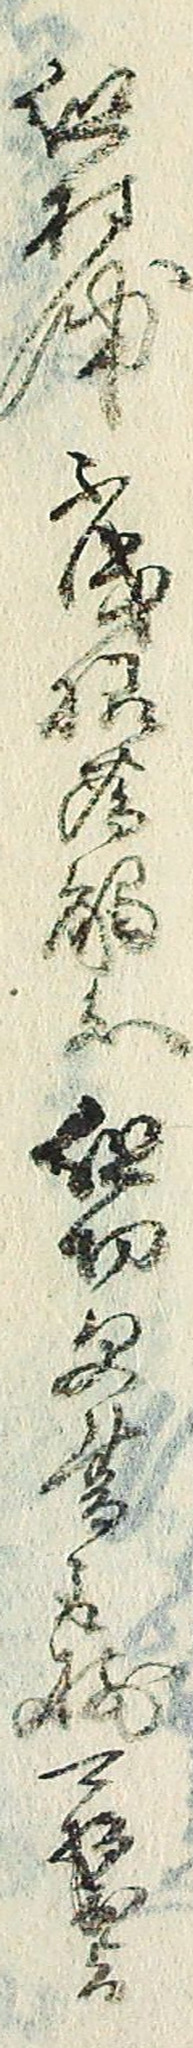組村浦不洩様為触知組切受書取揃可指出旨
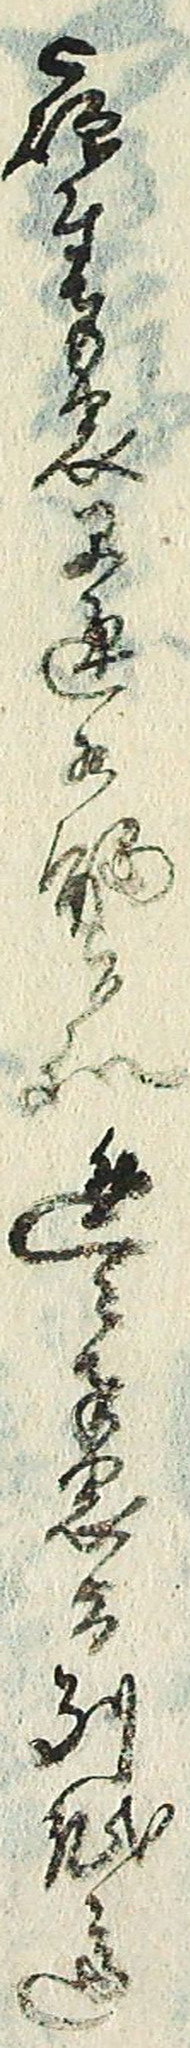被仰付奉畏早速相触候処逸々奉畏旨別紙之通
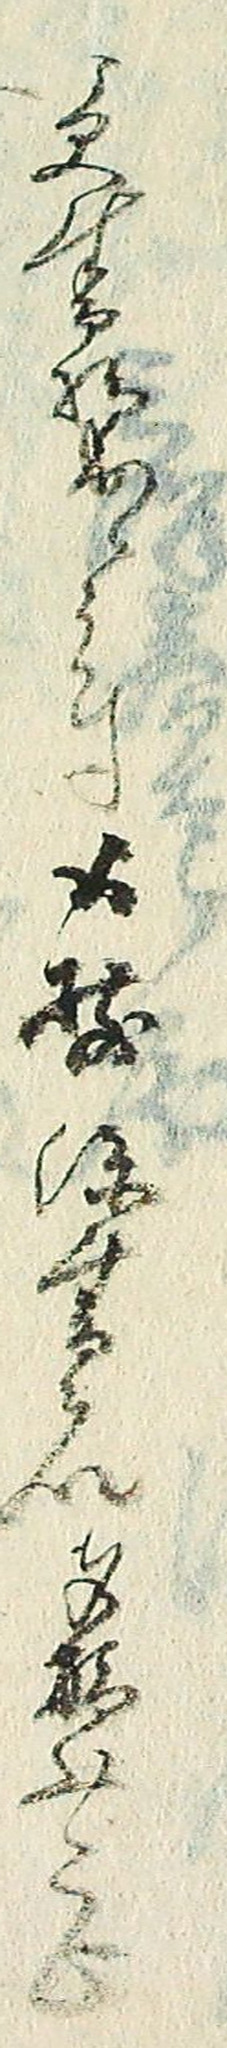受書指出候に付取揃添書を以奉指上候以上
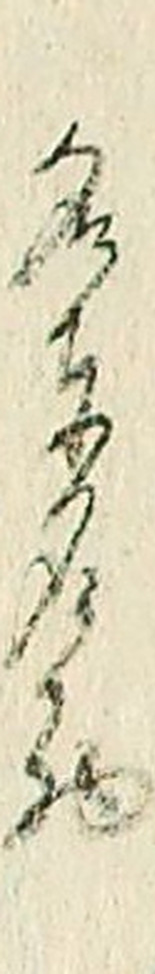名東名西
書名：諸御用御□受書控
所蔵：鳴門教育大学 Naruto University of Education
